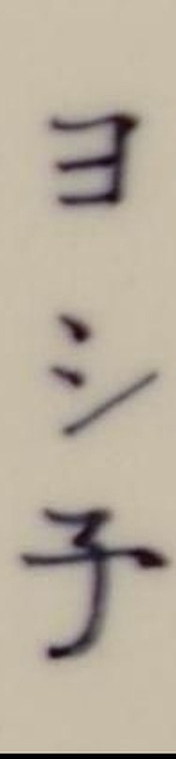ヨシ子
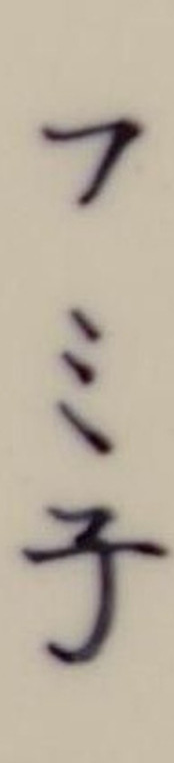フミ子
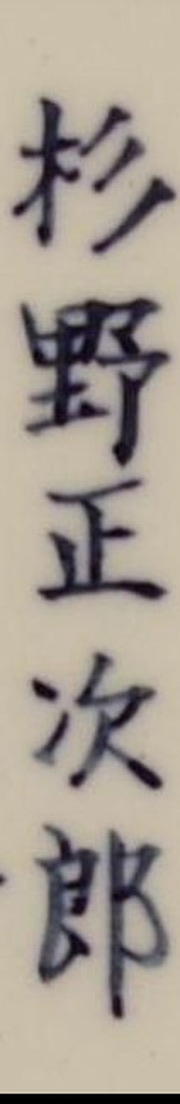杉野正次郎
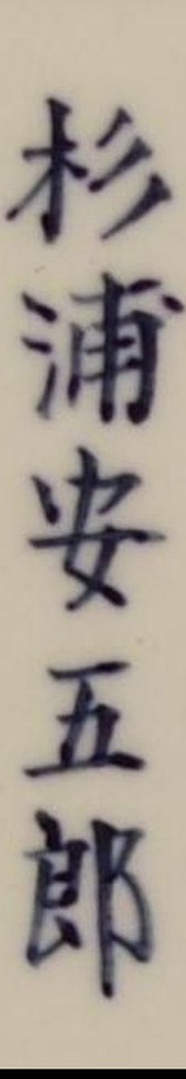杉浦安五郎
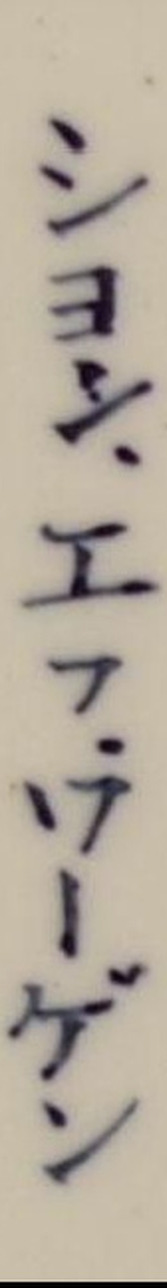ション、エフ、ワーゲン
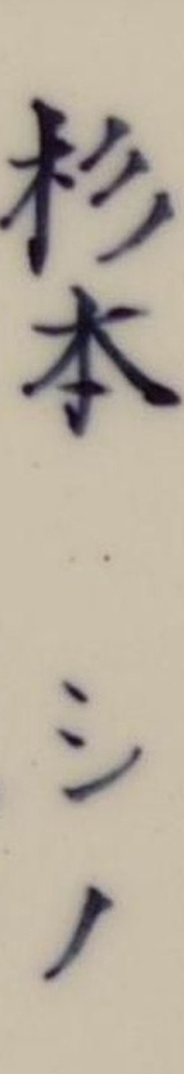杉本シノ
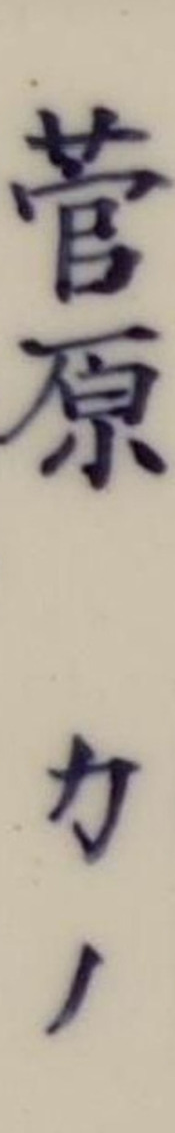菅原カノ
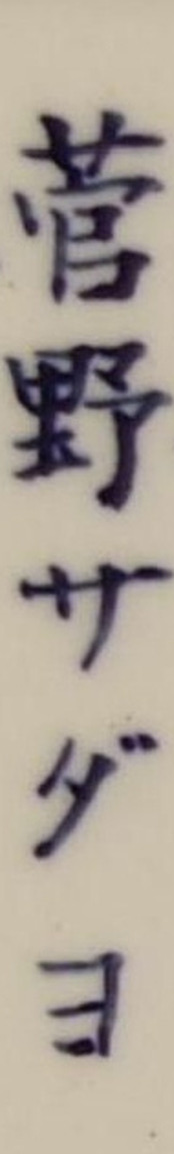菅野サダヨ
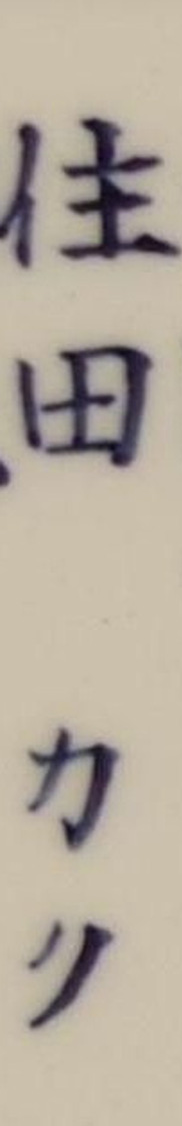住田カク
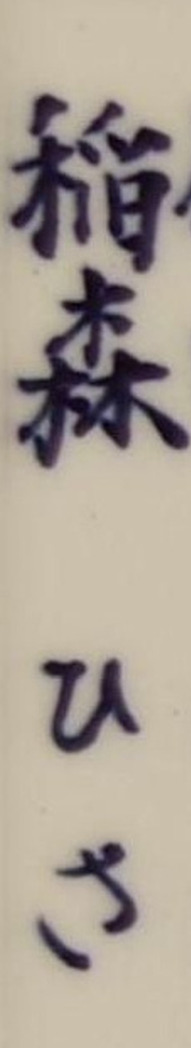稲森ひさ

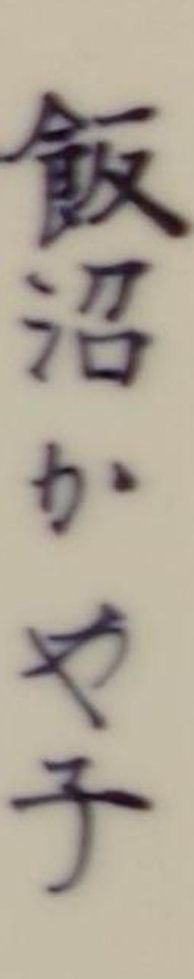飯沼かや子
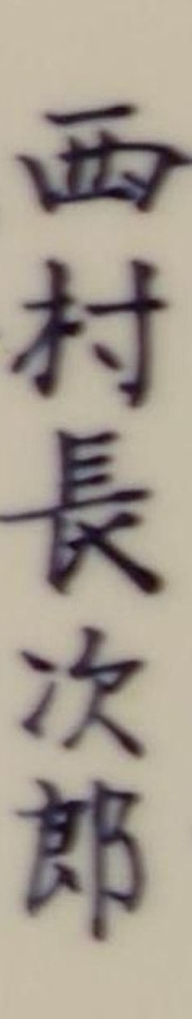西村長次郎
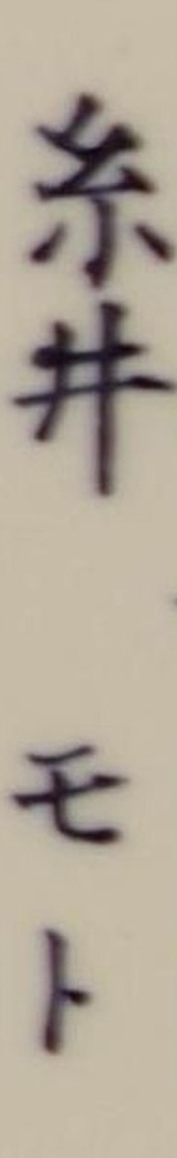糸井モト
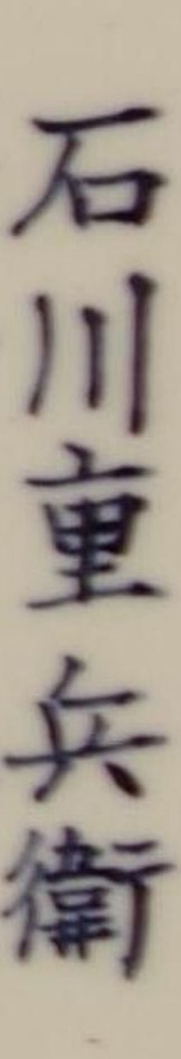石川重兵衛
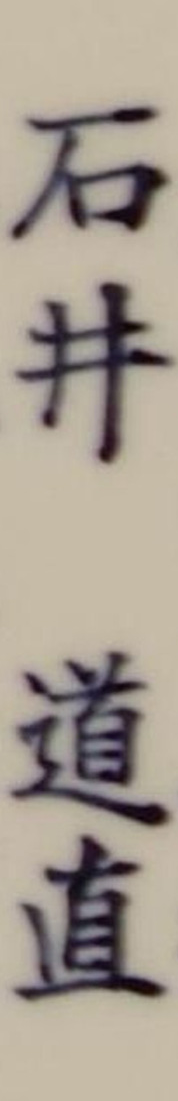石井道直
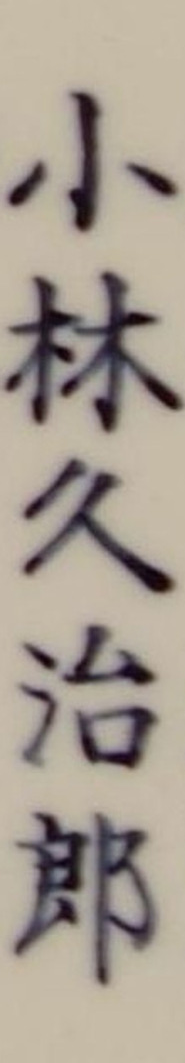小林久治郎
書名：M~S
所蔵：高野山金剛峯寺
